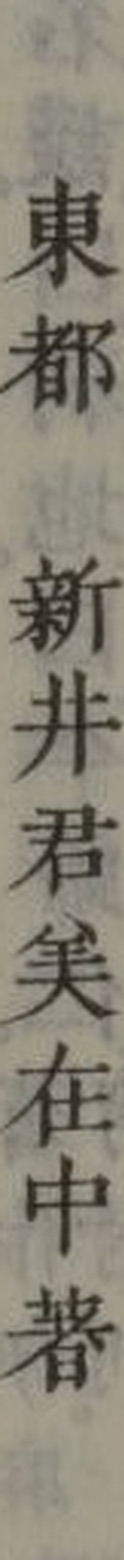東都新井君美在中著
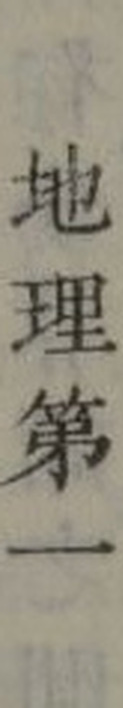地理第一
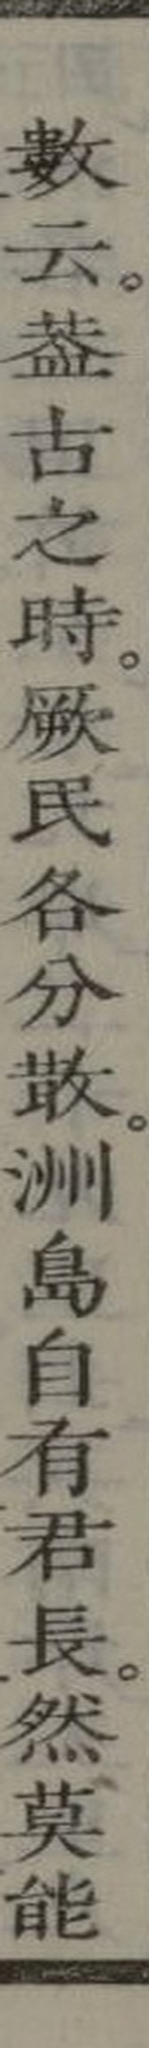數云。葢古之時。厥民各分散。洲島自有君長。然莫能
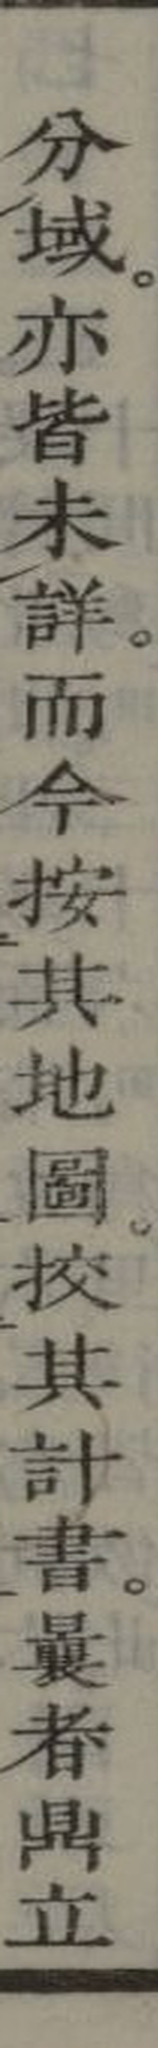分域。亦皆未詳。而今按其地圖。挍其計書。曩者鼎立

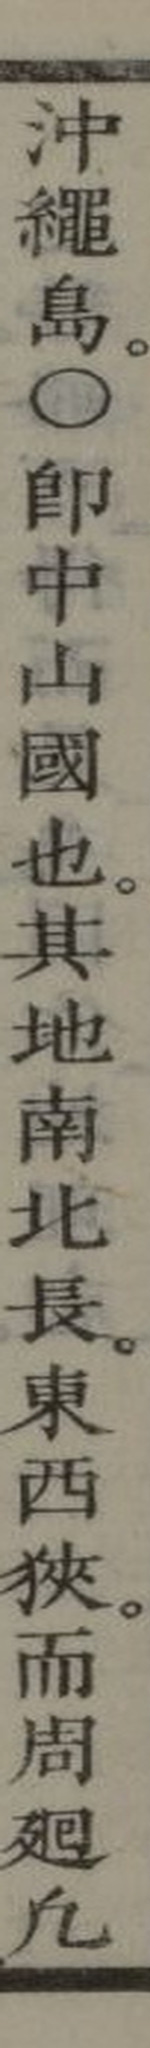沖繩島。○卽中山國也。其地南北長。東西狹。而周廻凢
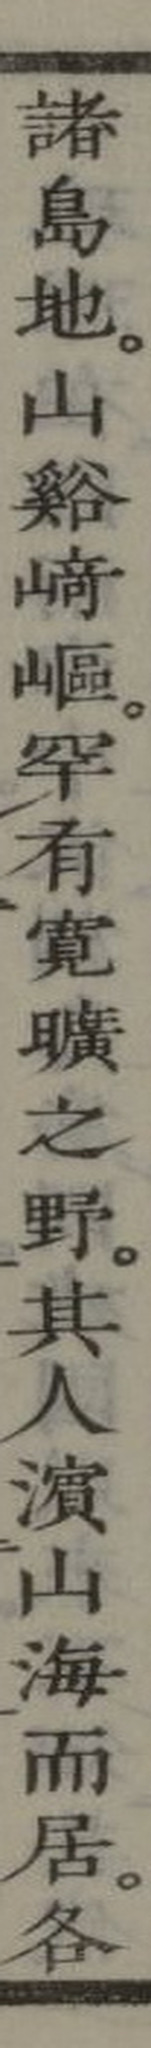諸島地。山谿﨑嶇。罕有寛曠之野。其人濵山海而居。各
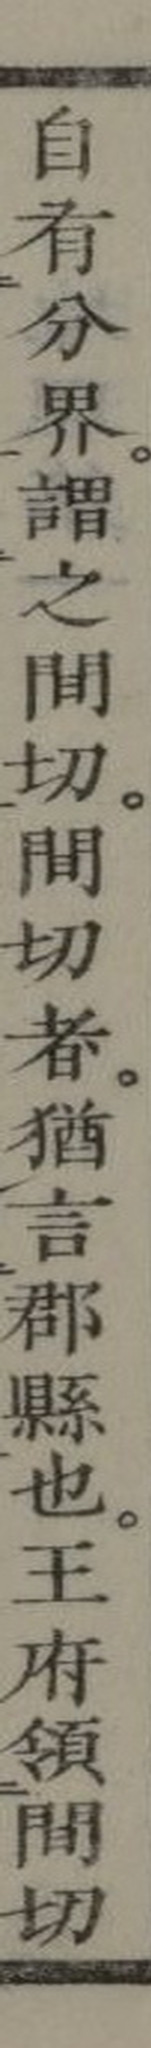自有分界。謂之間切。間切者。猶言郡縣也。王府領間切

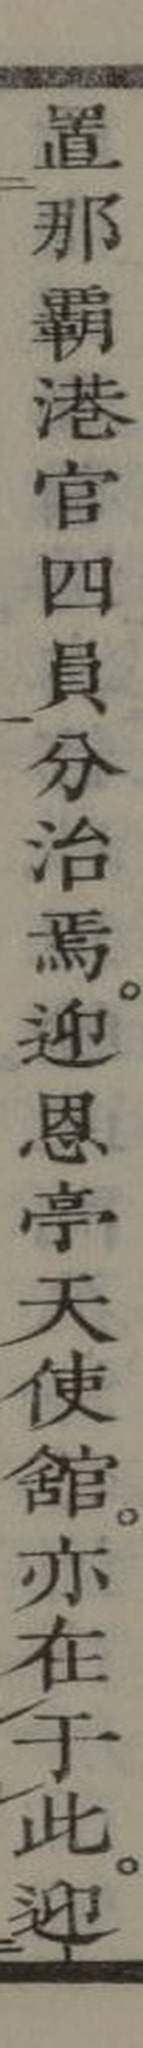置那覇港官四員分治焉。迎恩亭天使舘。亦在于此。迎-
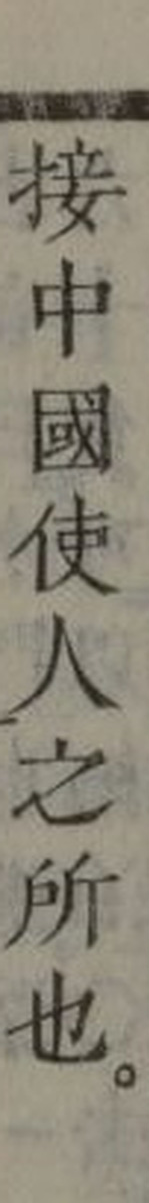接中國使人之所也。
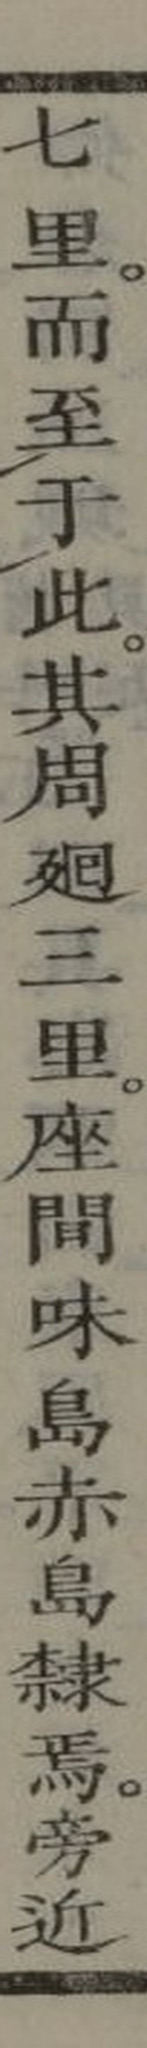七里。而至于此。其周廻三里。座間味島赤島隸焉。旁近
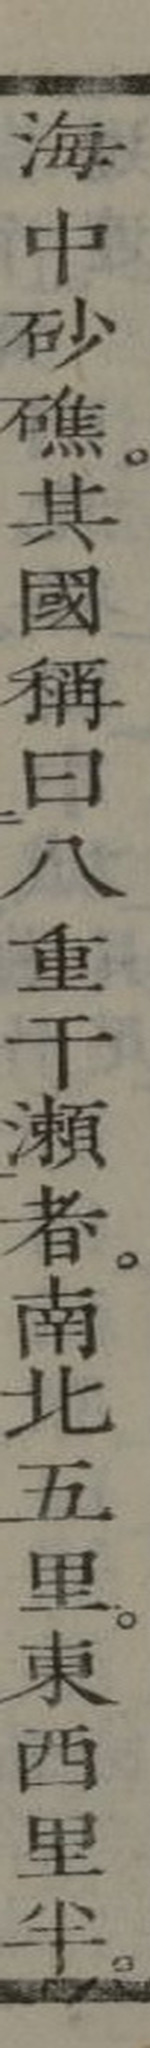海中砂礁。其國稱曰八重干瀬者。南北五里。東西里半。
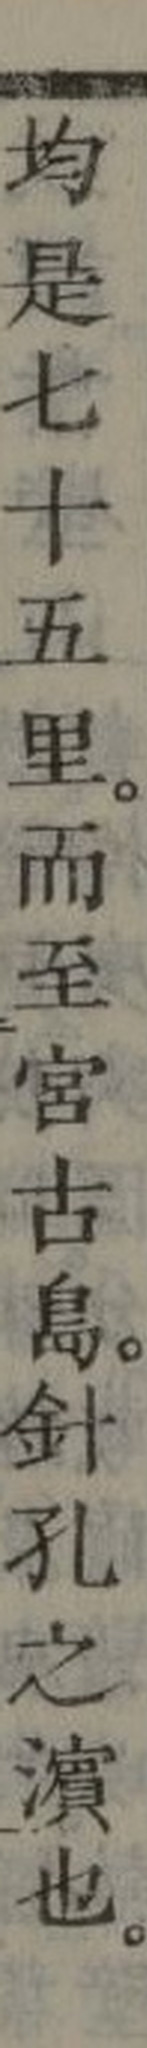均是七十五里。而至宮古島。針孔之濵也。
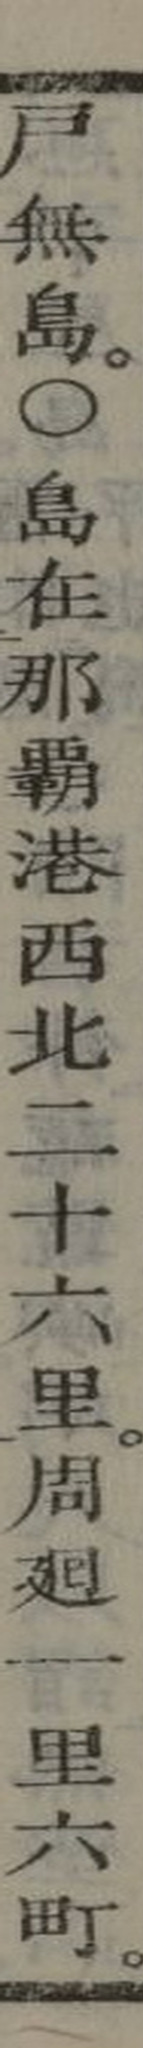戸無島。○島在那覇港西北二十六里。周廻一里六町。

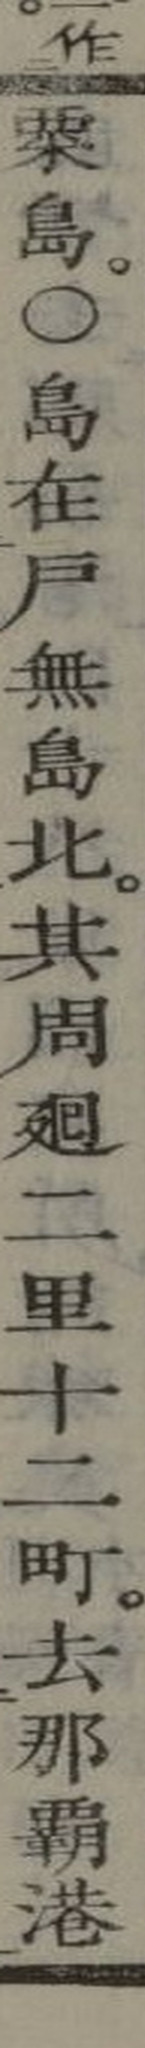粟島。○島在戸無島北。其周廻二里十二町。去那覇港
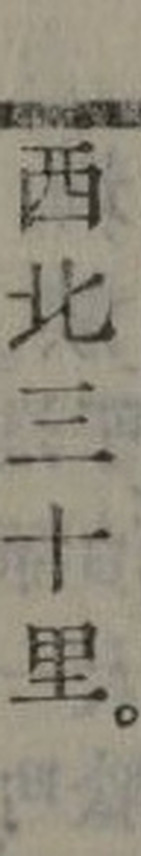西北三十里。
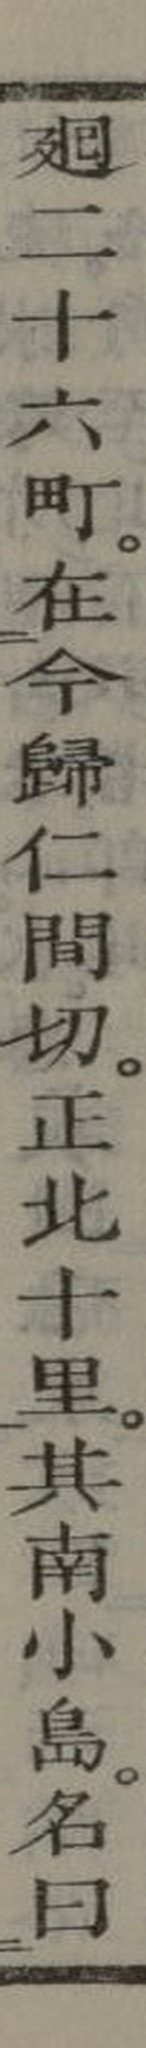廻二十六町。在今歸仁間切。正北十里。其南小島。名曰
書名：南島志 呂
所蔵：University of the Ryukyus Library
